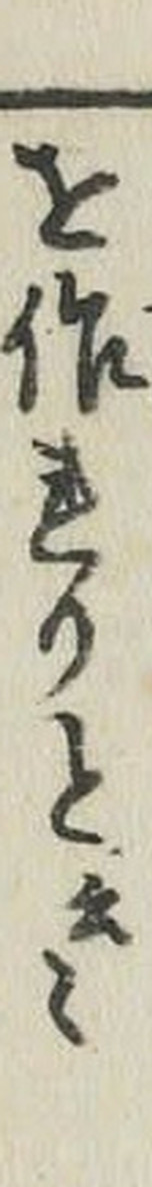を作れりと云々

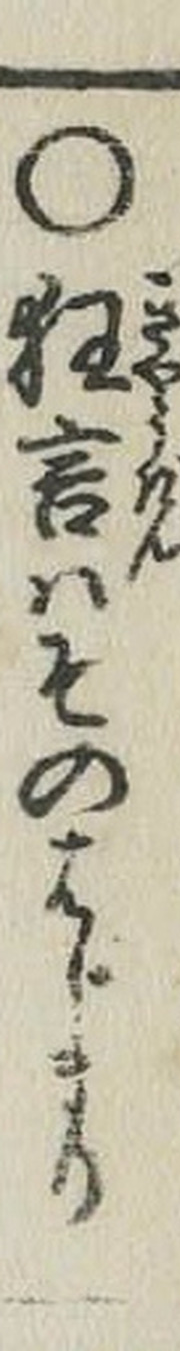○狂言はそのはじまり
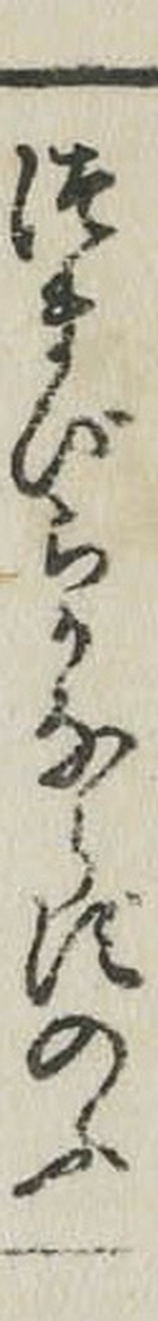つまびらかならずのふ
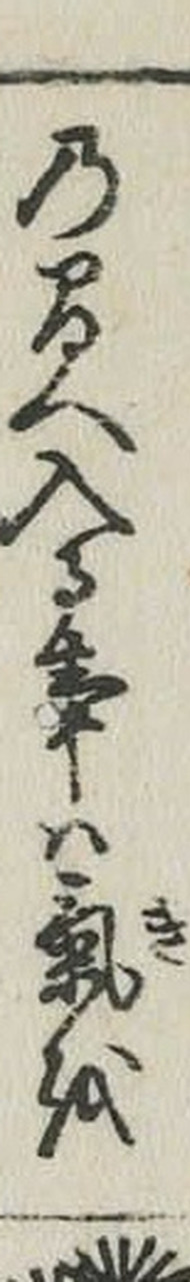の間へ入る事は気を
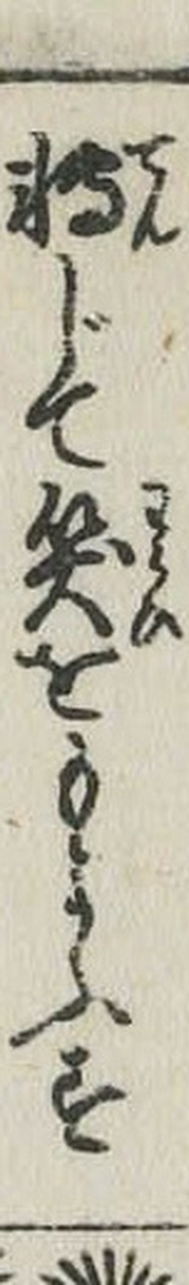転じて笑をもよふす
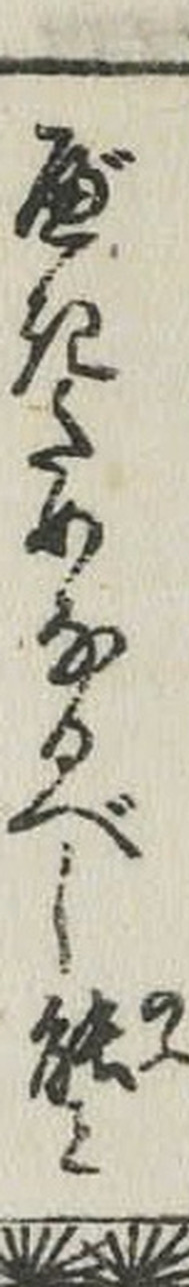べきためなるべし能と
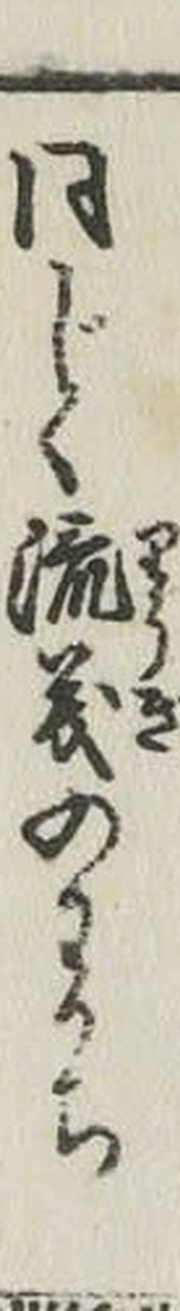同じく流義のわかち
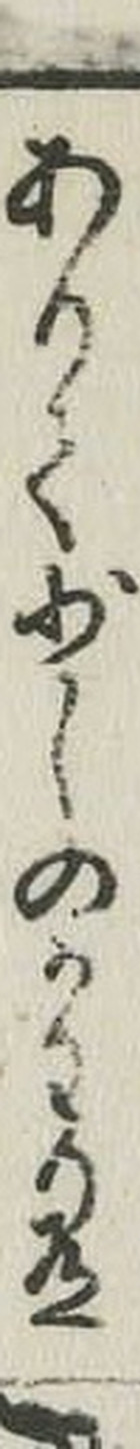ありて少しのかわり有
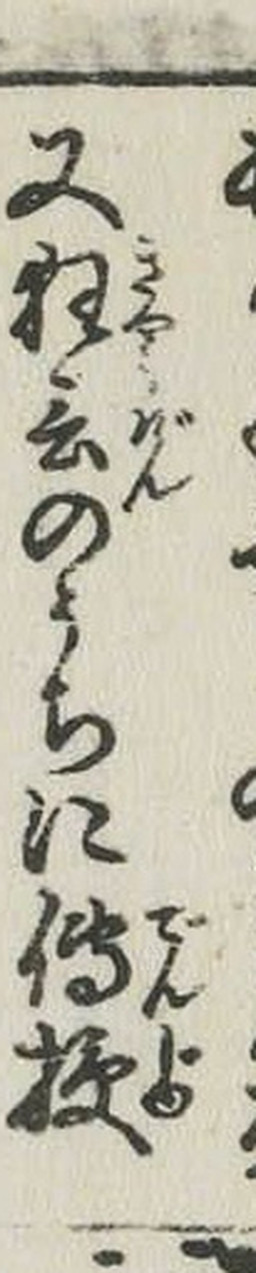又狂言のうちに伝授
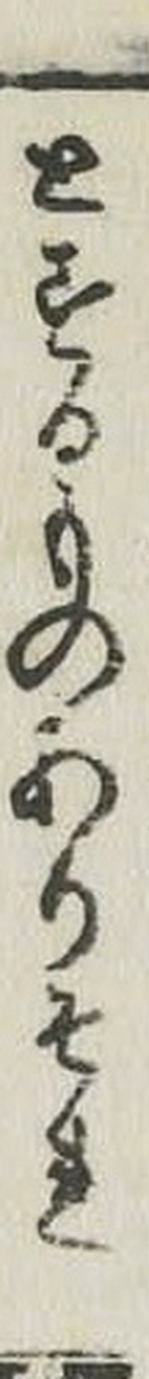とするものありそれ
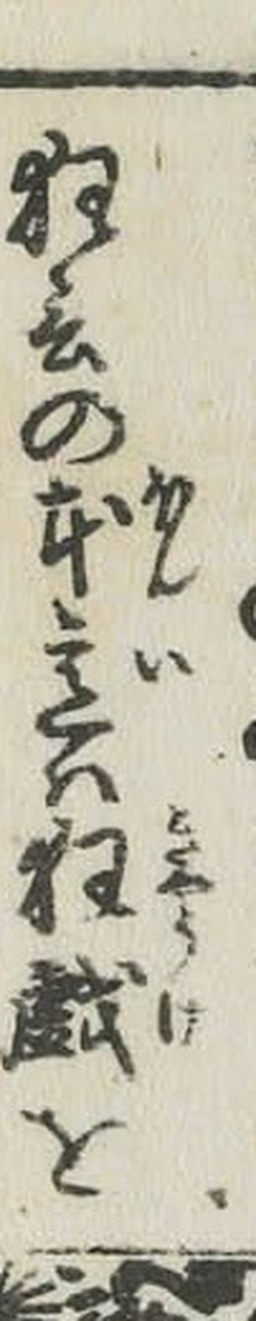狂言の本意は狂戯を
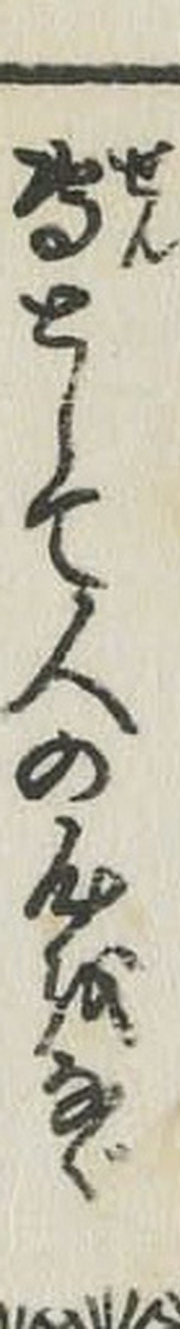専として人の心をなぐ
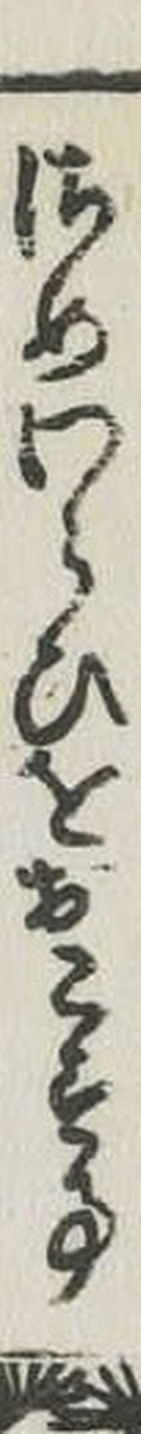さめわらひをおこす事
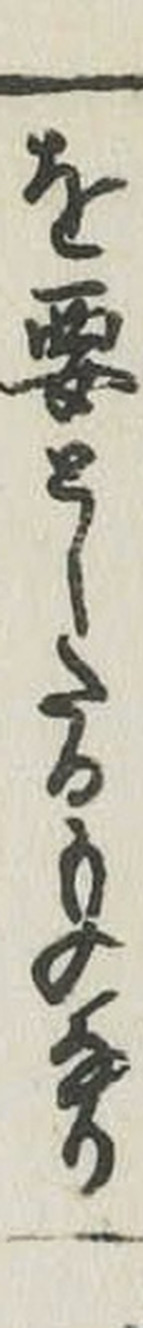を要としたるものなり
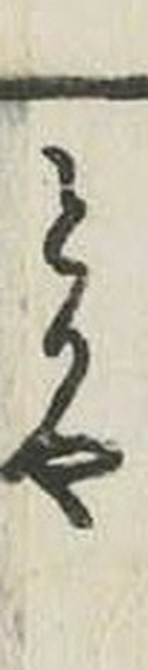とかや
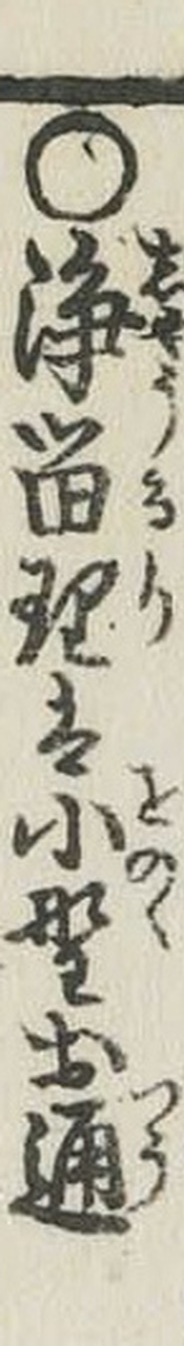○浄留理は小野お通
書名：増補頭書訓蒙図彙大成 10巻 10:巻之21
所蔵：東京学芸大学教育コンテンツアーカイブ
